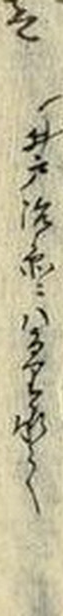井戸治兵衛ニ八百里承之
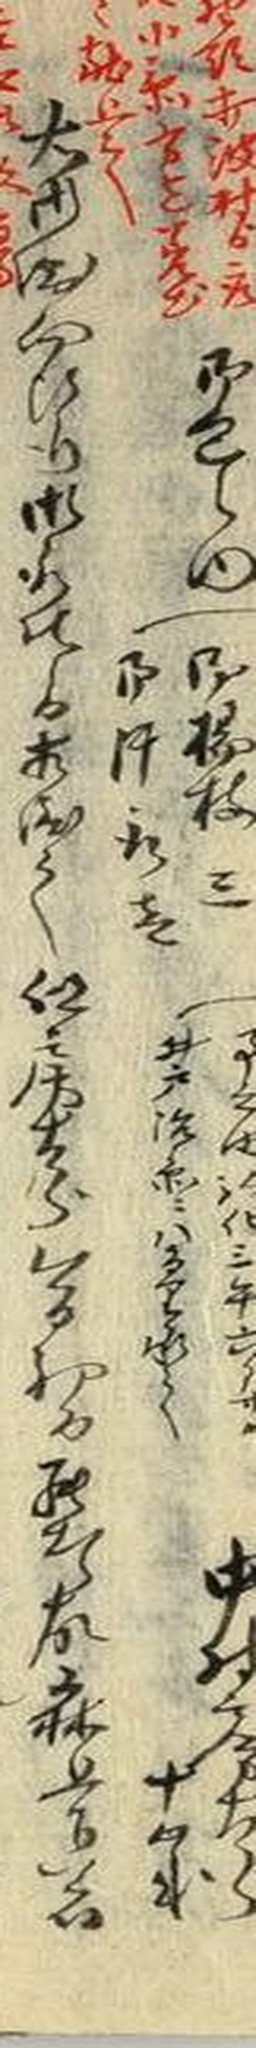右御側向頭取御取次ニ而相渡之但房太郎今日初而罷出候故麻上下着
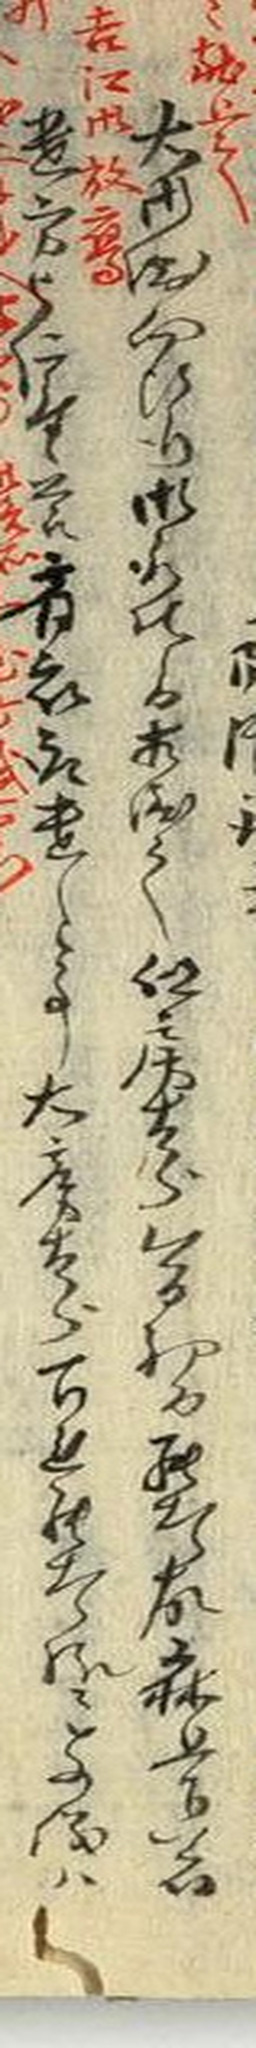遣方被仰付候節肩衣取遣候事右房太郎召連罷出候様ニとの儀ハ
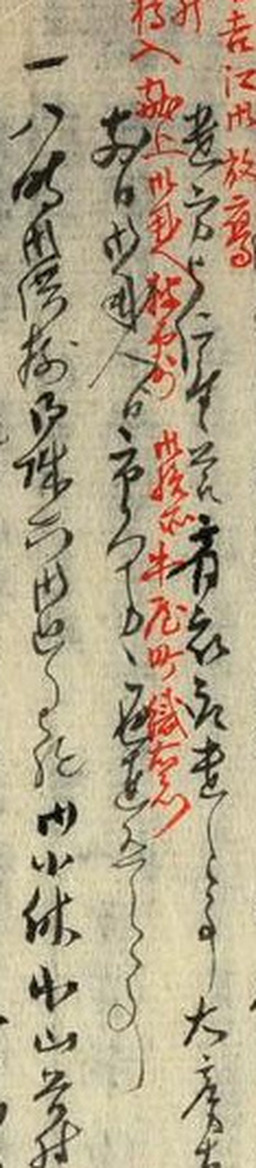前日御用人ゟ市右衛門方へ通達有之候事
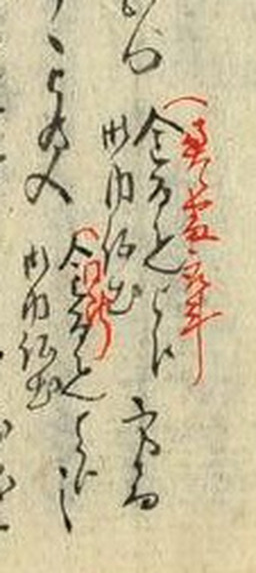御内証出方ニ而
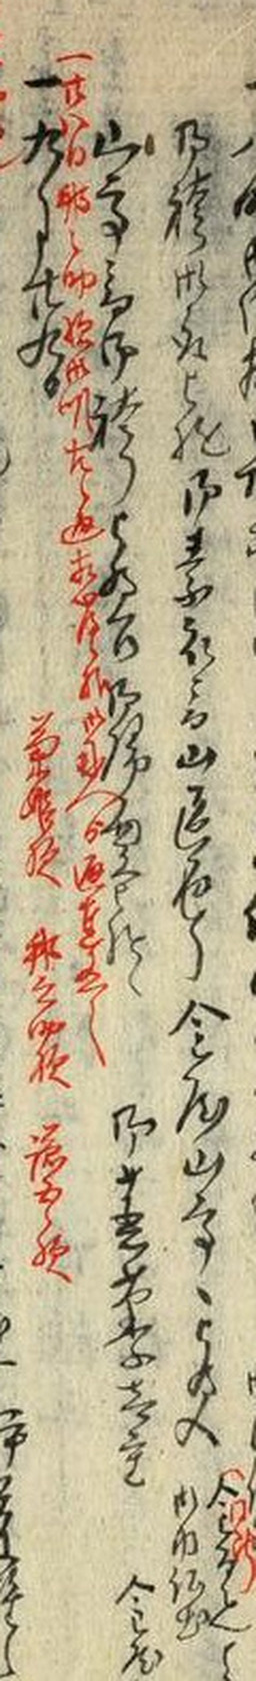山亭ニ而御袴被為召御帰殿被遊候御蒸菓子壱重金屋献上
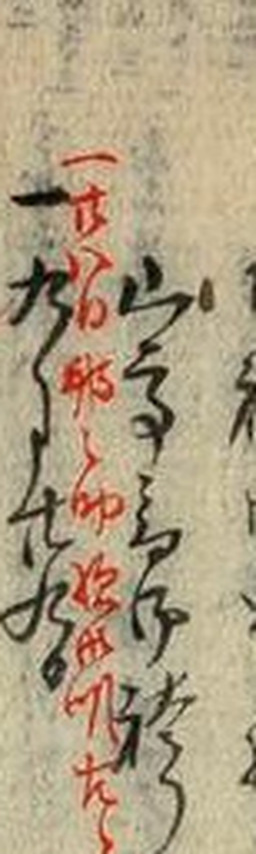一九月廿九日
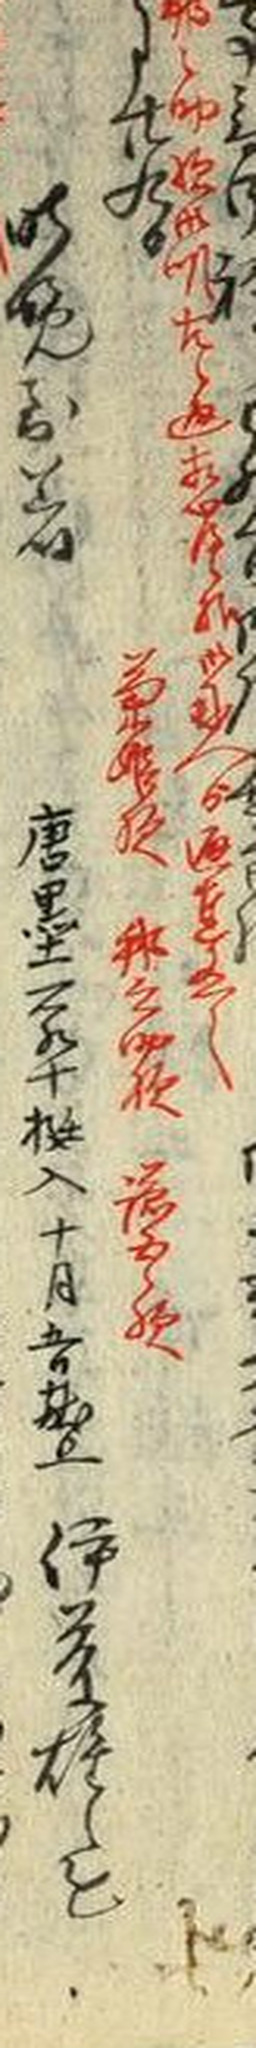昨晩到着唐墨一箱十挺入十月五日献上伊藤雄之進
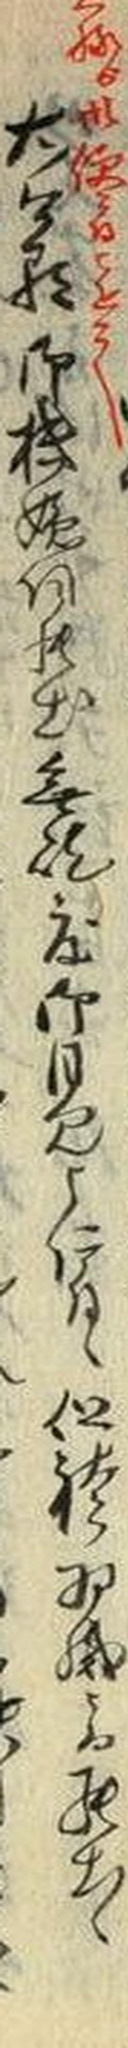右今朝御機嫌伺罷出無屹度御目見被仰付候但袴羽織ニ而罷出候
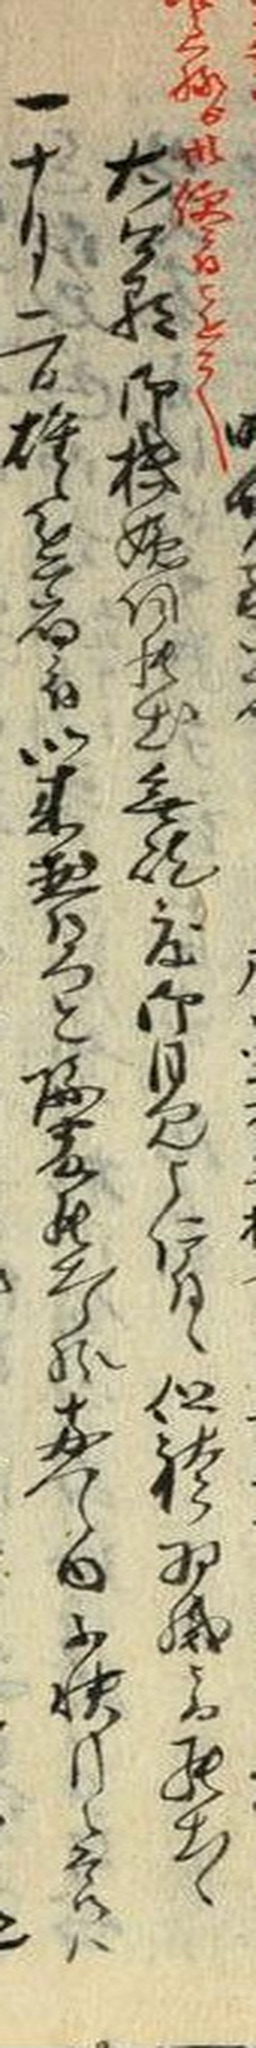一十月二日雄之進着ニ付以来惣左衛門と隔番罷出候様両人之内不快引之節ハ
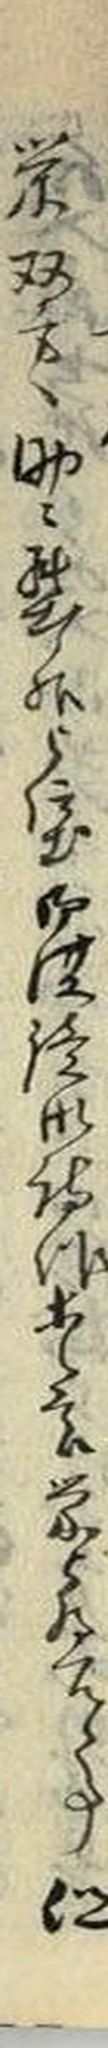栄双方へ助ニ罷出候様被仰出御復読御詩作等之節栄被為召候事但
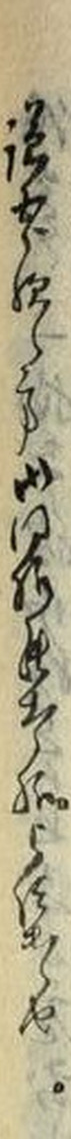謙五郎様之方御同様罷出候様被仰出候由
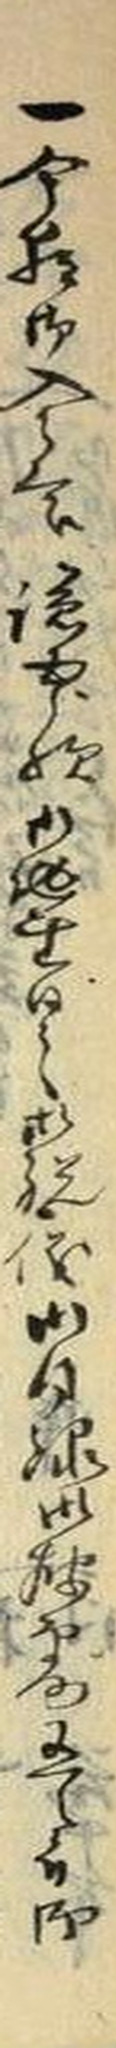一今朝御入之節謙五郎様御誕生日之御祝儀御目録御披露有之ニ付御
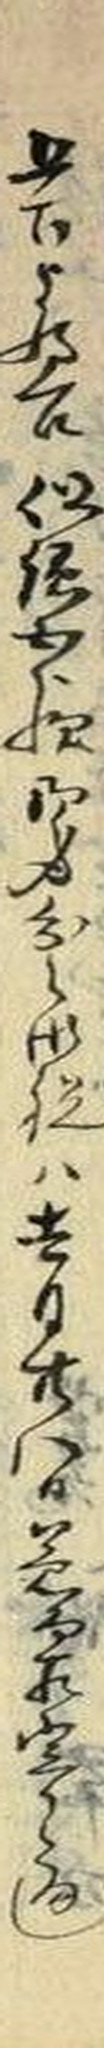上下被為召但謙五郎様御見分之御祝ハ去月廿八日兼而相定候通
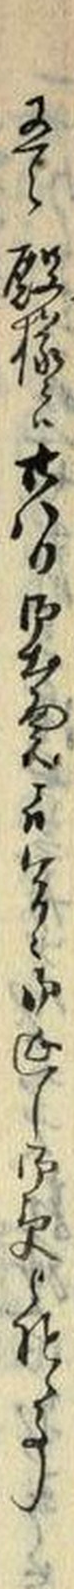有之候殿様ニハ廿八日御出殿ニ付今日ニ御延し御受被遊候事
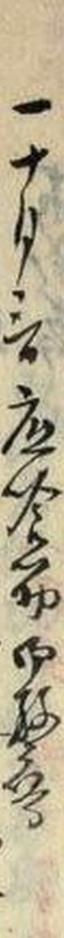一十月三日底喰筋御放鷹
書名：少傅日録抄（斉承付側向頭取日記、在国）
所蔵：福井県文書館 Fukui Prefectural Archives
